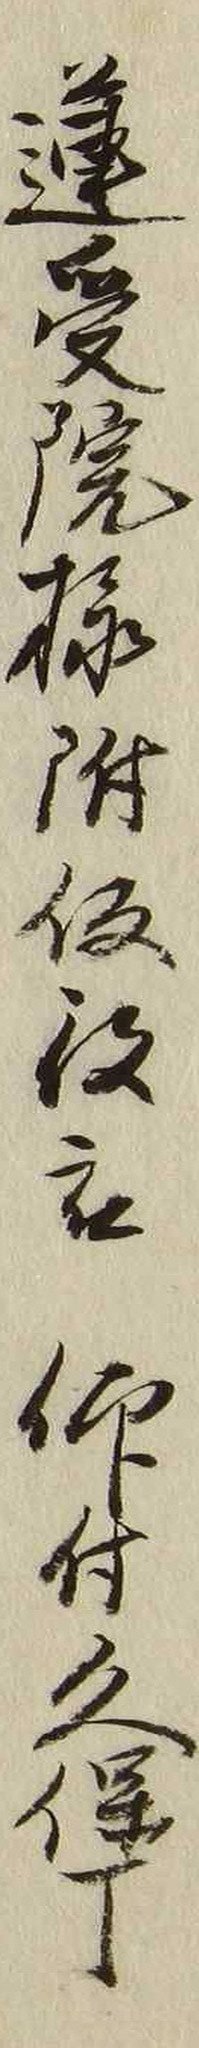蓮受院様附仮役被仰付久保丁
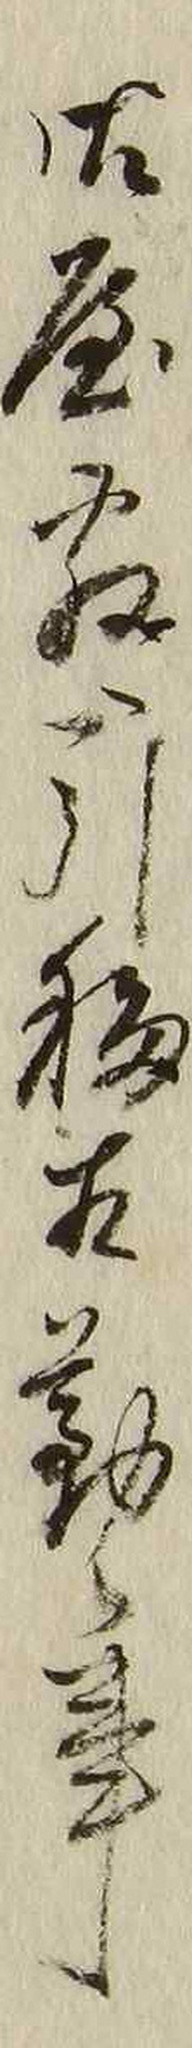御屋敷へ引移相勤候事
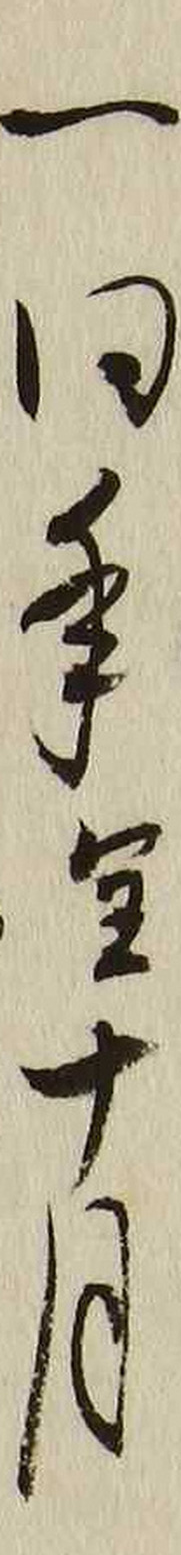一同年閏十月
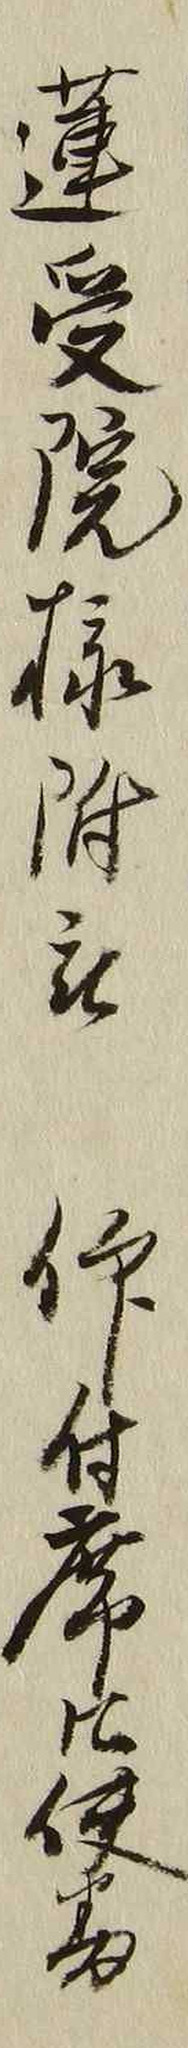蓮受院様附被仰付席御使番
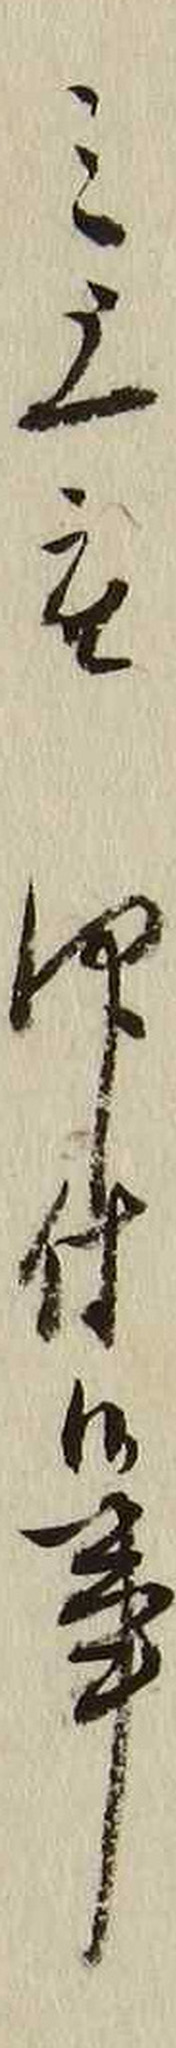之上被仰付候事
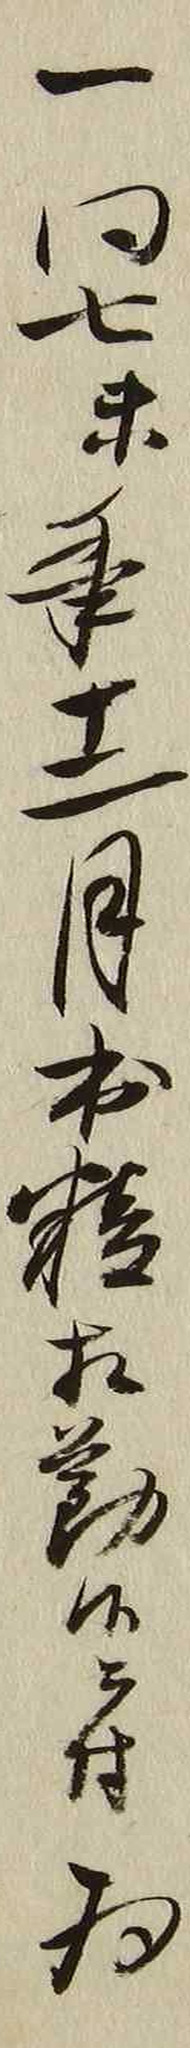一同七未年十二月出精相勤候ニ付為
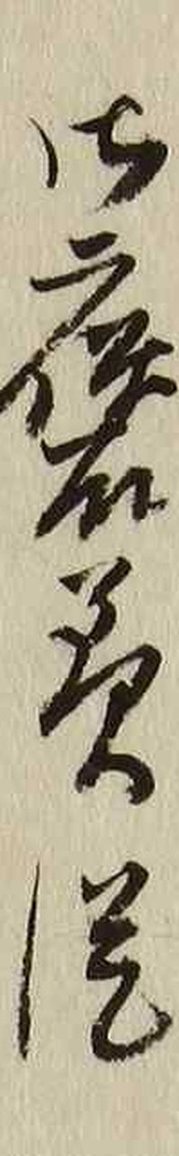御褒美従
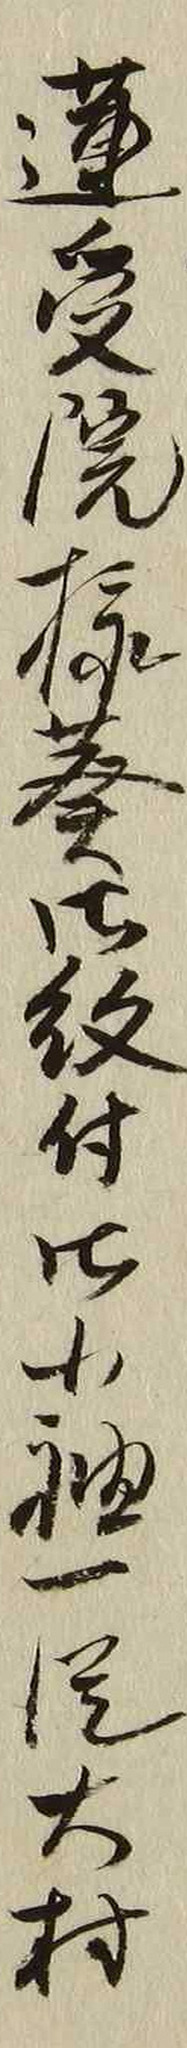蓮受院様葵御紋付御小袖一従大村
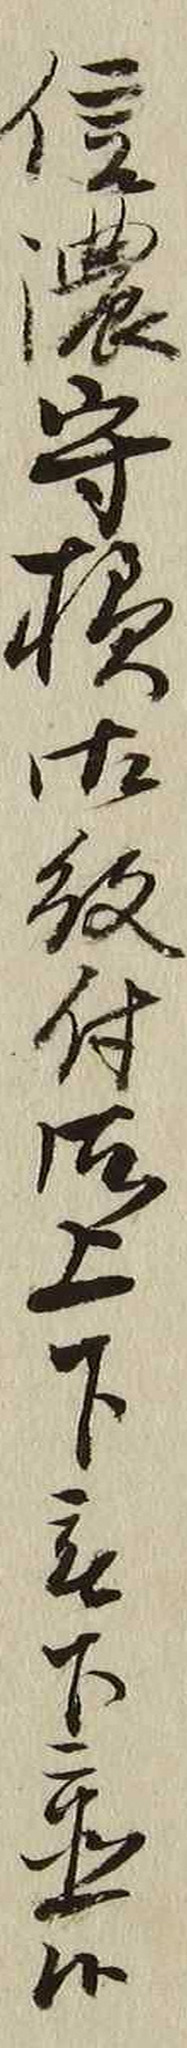信濃守様御紋付御上下被下置候
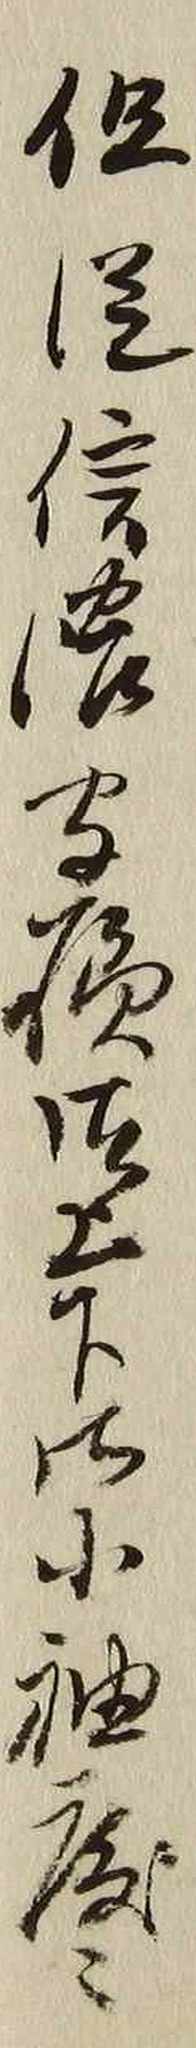但従信濃守様御上下御小袖度々
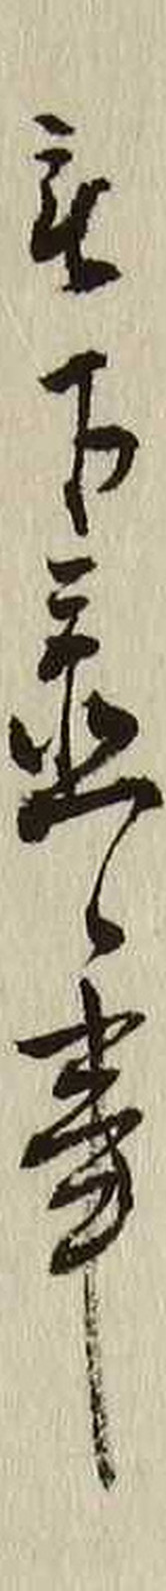被下置候事
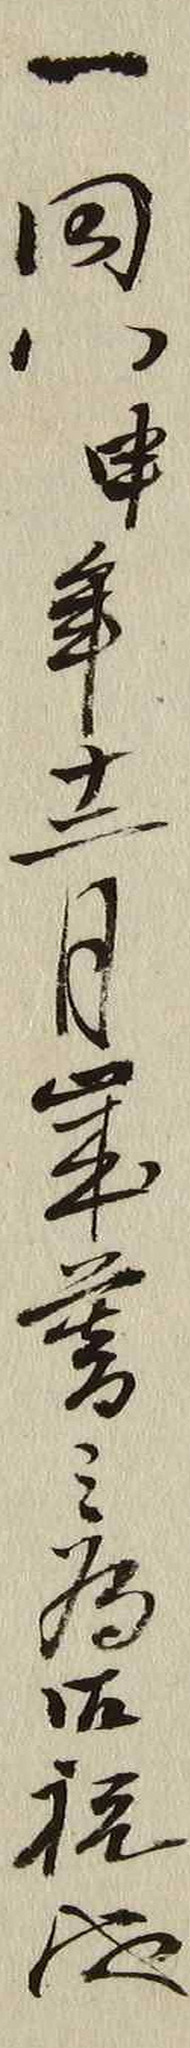一同八申年十二月歳暮之為御祝儀
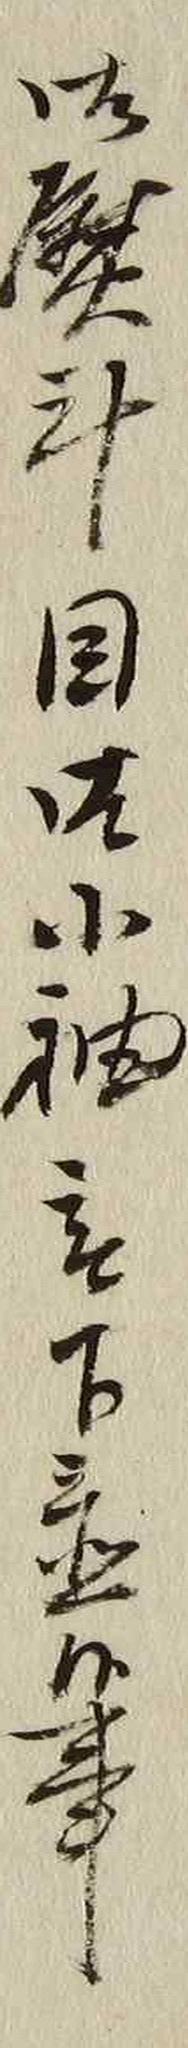御熨斗目御小袖被下置候事
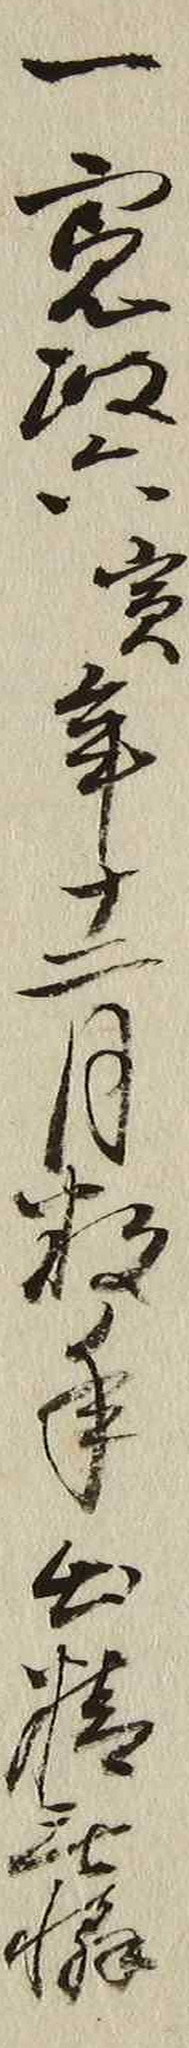一寛政六寅年十二月数年出精無懈
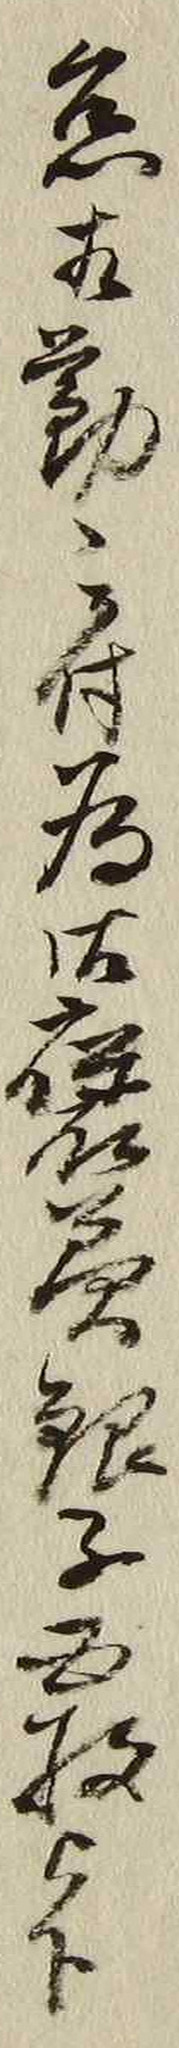怠相勤候ニ付為御褒美銀子五枚被下
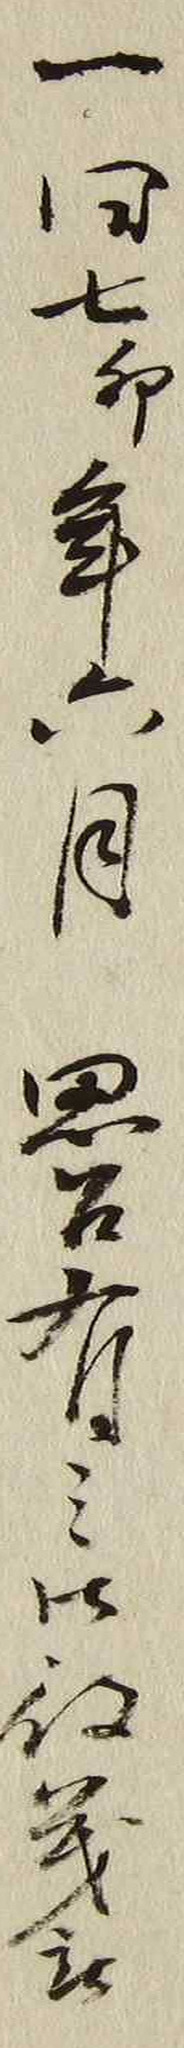一同七卯年六月思召有之御役義被
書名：諸士系譜　巻之352　す之部2
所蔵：会津若松市立会津図書館
